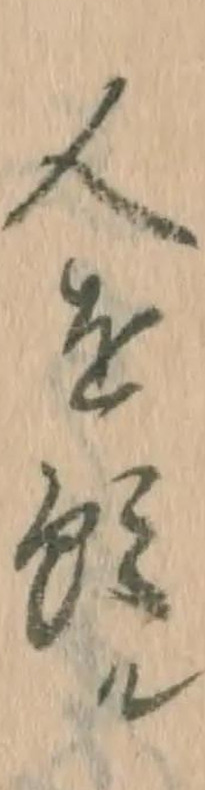人を預る
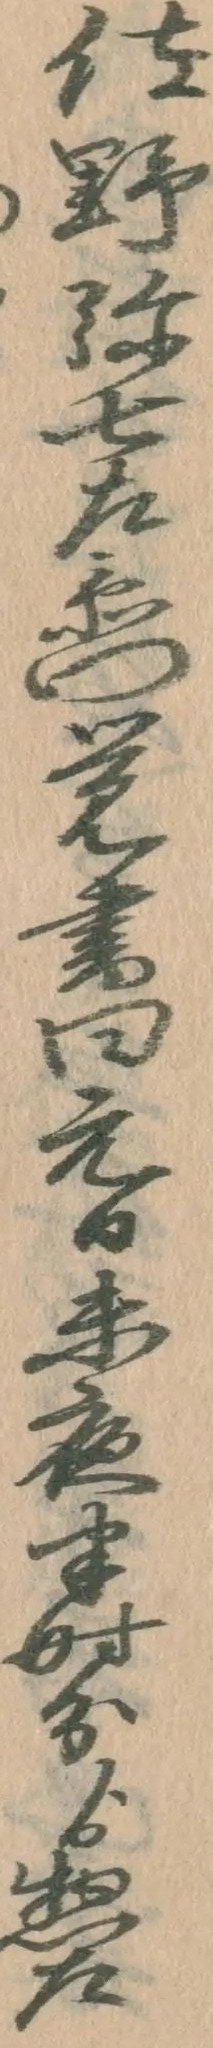佐野弥七左衛門覚書曰元日未夜半時分ゟ惣左
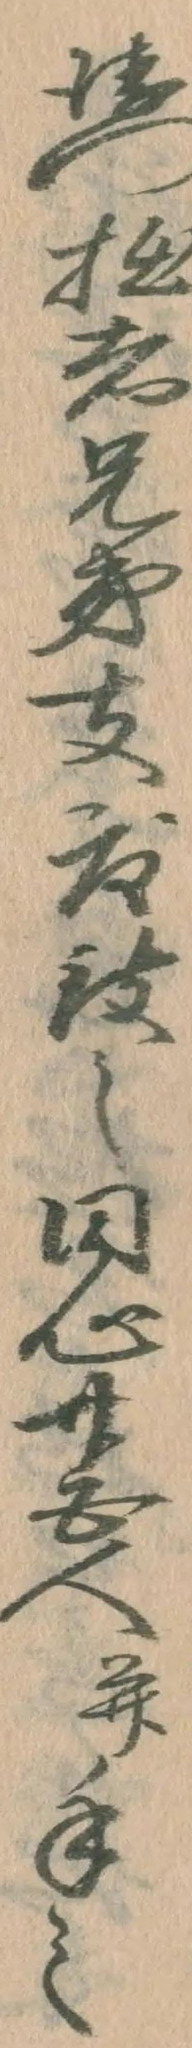衛門拙者兄弟支度致し同心廿五人幷手之
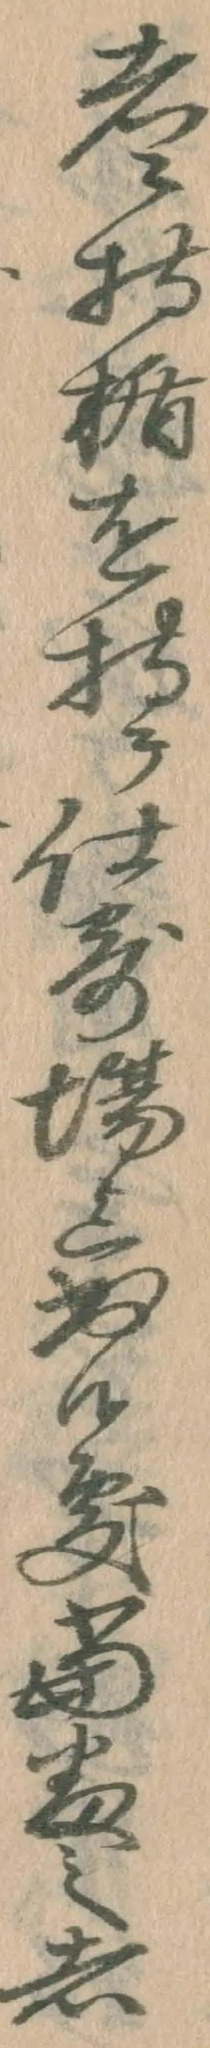者に持楯を持て仕寄場迄出候處当番之者
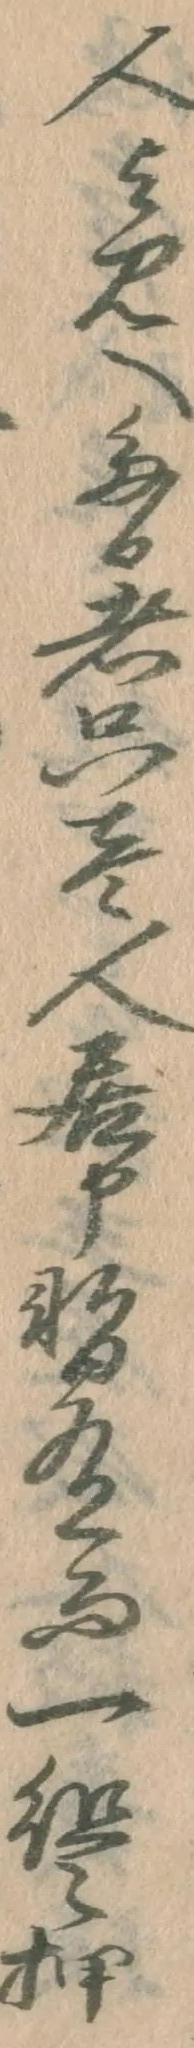人与見へ多る者只壱人居申暫有而一組に押
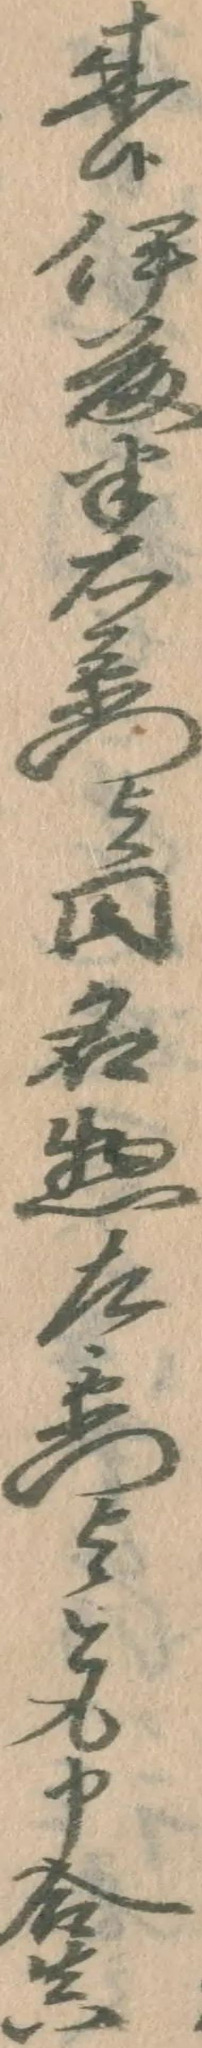来候伊藤半右衛門与同名惣左衛門与とも申合真
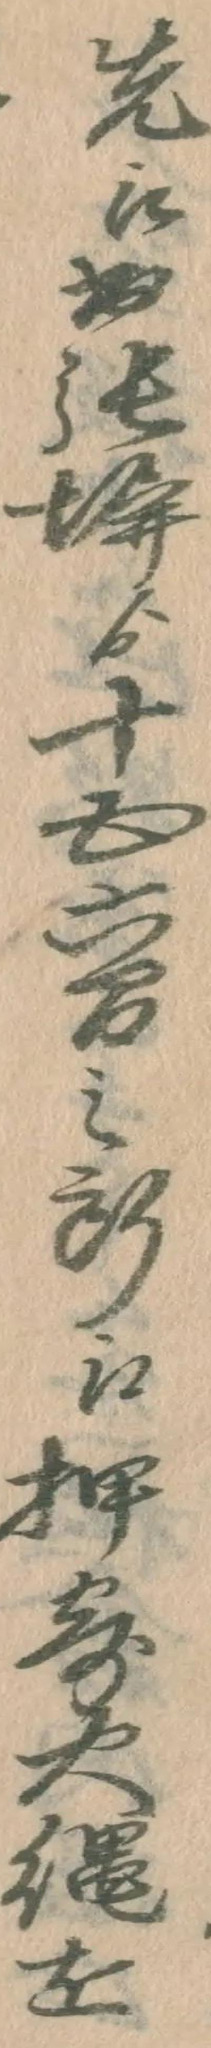先江出張塀ゟ十五六間之所江押寄火縄を
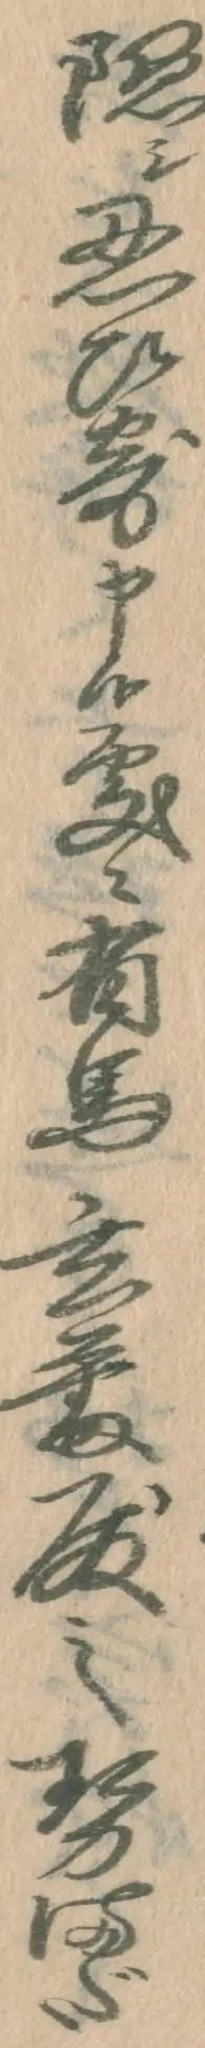隠し忍ひ寄申候處に有馬玄蕃殿之勢満だ
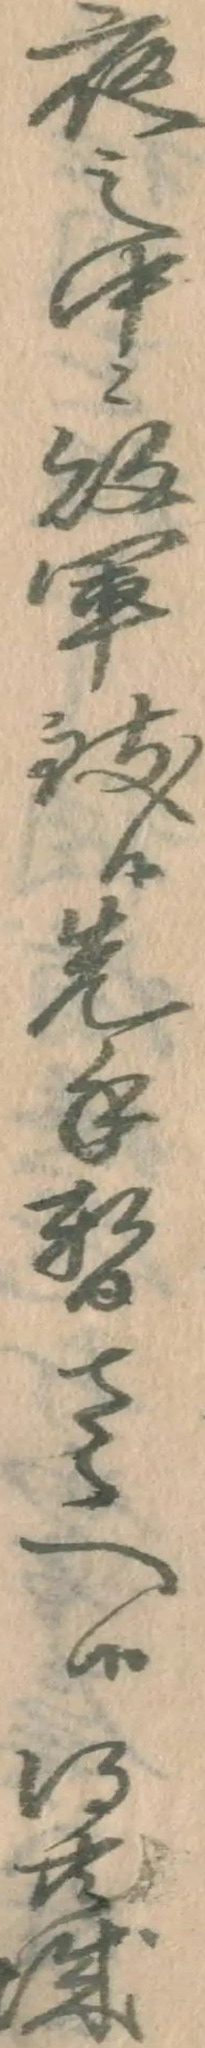夜之中に敗軍致候先手暫さゝへ候得共城

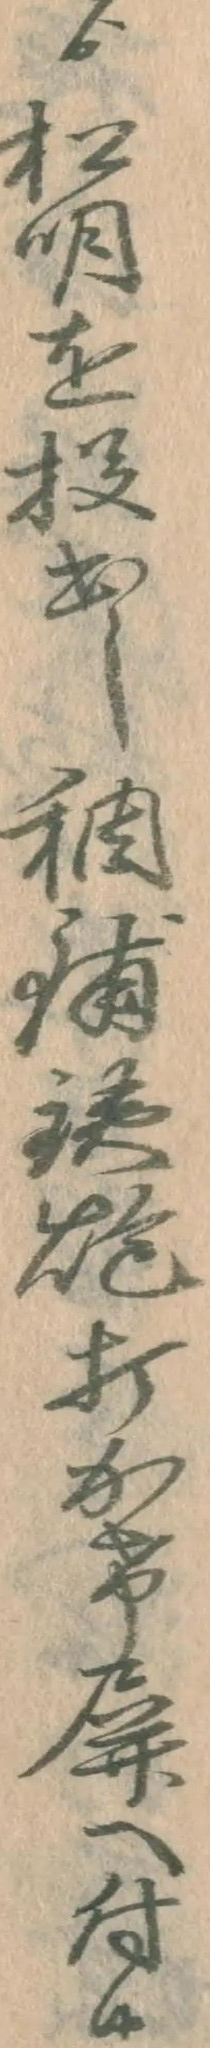ゟ松明を投出し稠鋪鉄砲打加希屏へ付候
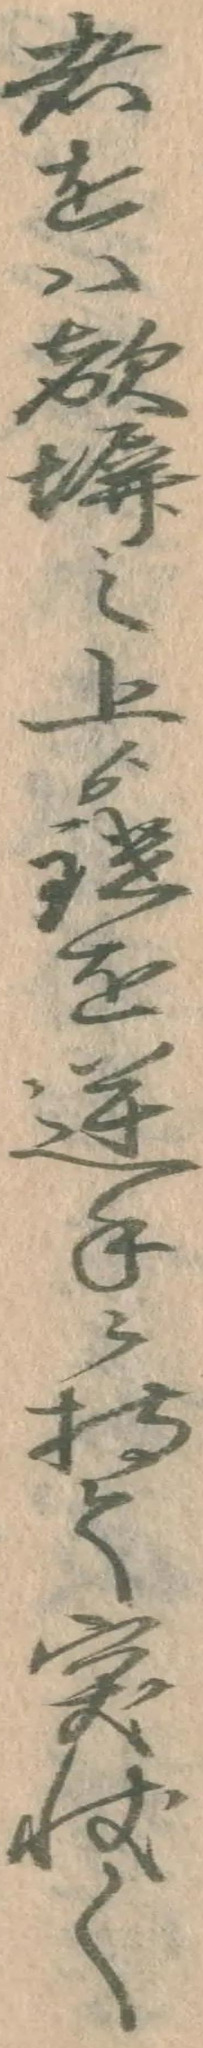者をは敵塀之上ゟ鑓を逆手に持て突状〳〵
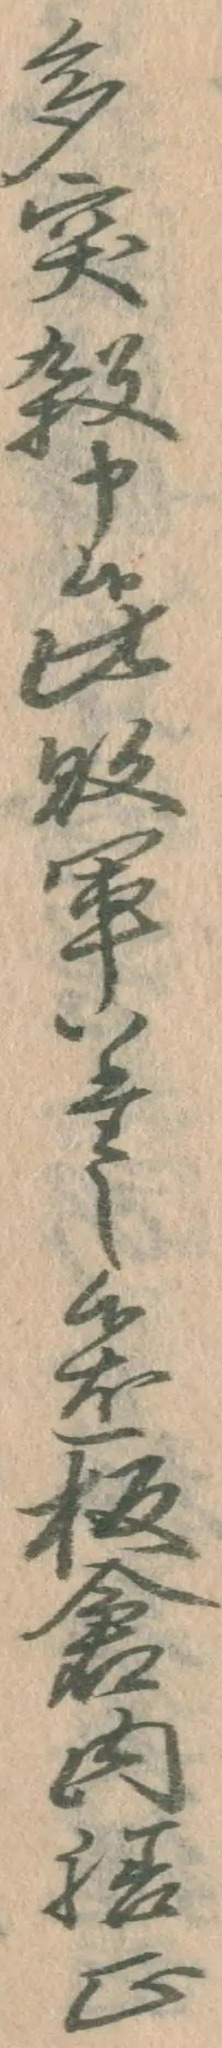多突殺申候此敗軍い堂し候を板倉内膳正
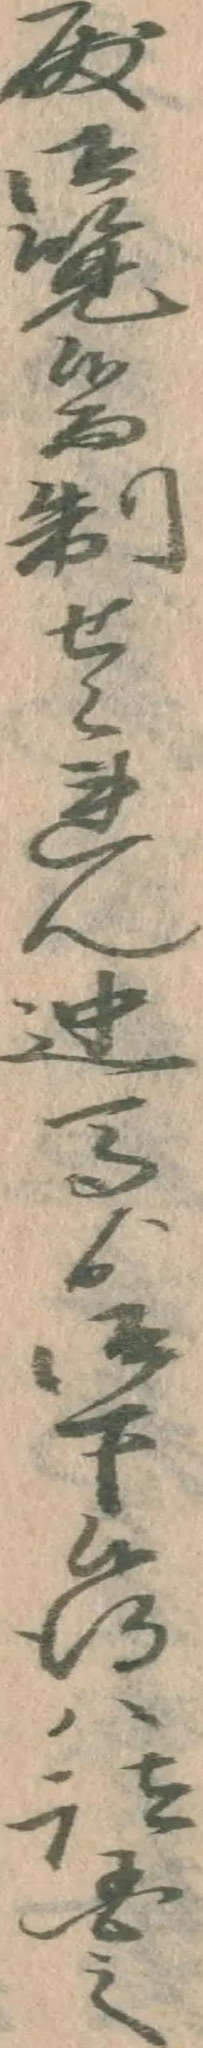殿御覧候而制せら連ん迚馬ゟ御下候得は諸国之
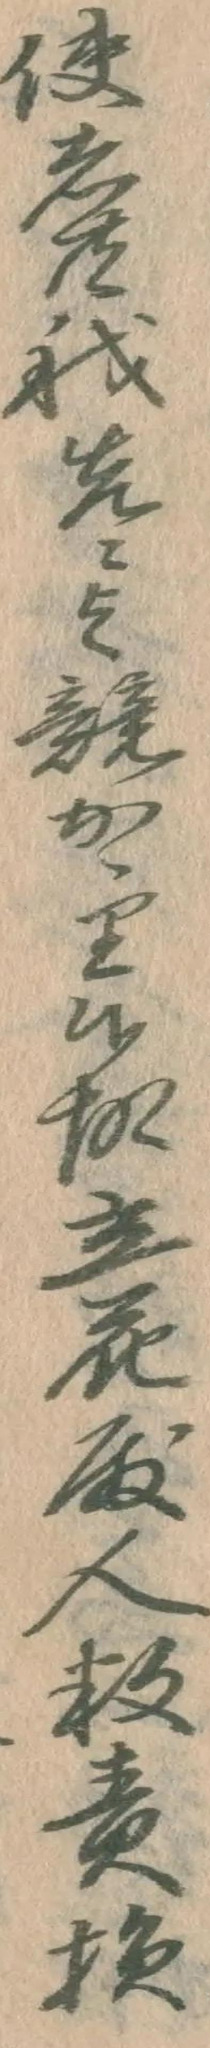使者共我先に与競かゝ里候故立花殿人数責損
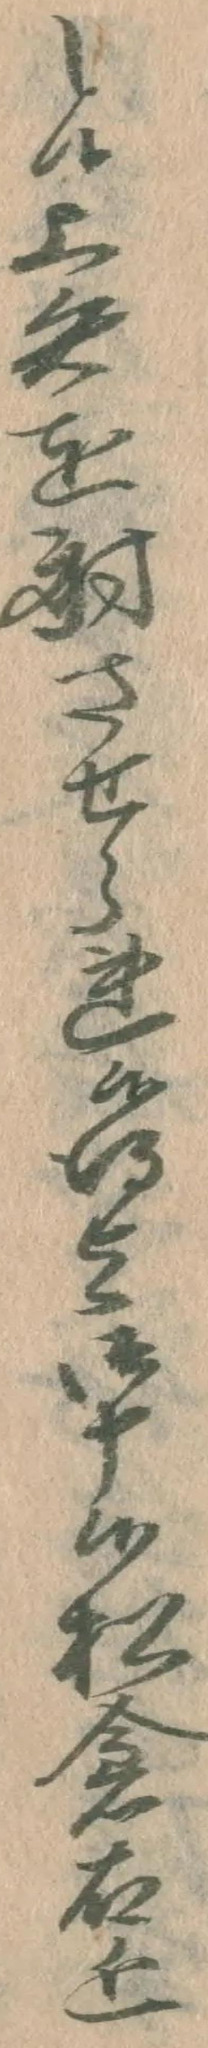し候上矢を射させら連候得与御申候松倉右近
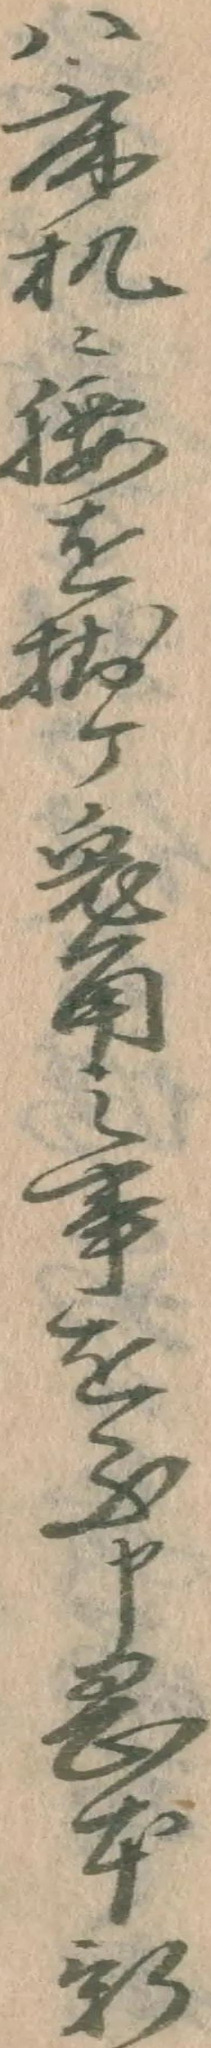は床机に腰を掛け兎角之事をふ申岡本新
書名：切支丹御退治記 49巻. [5]
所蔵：国立国会図書館 National Diet Library, JAPAN
